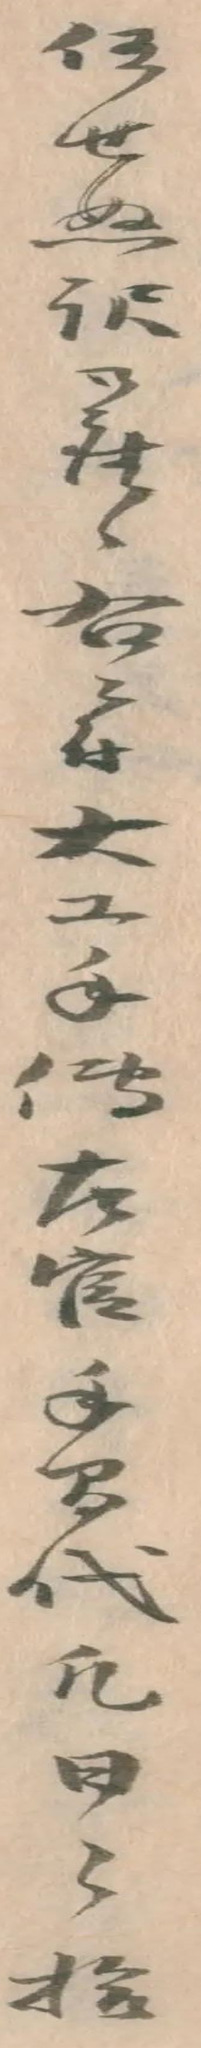任ぬ訳御座候右二付大工手伝左官手間代凡日々拾
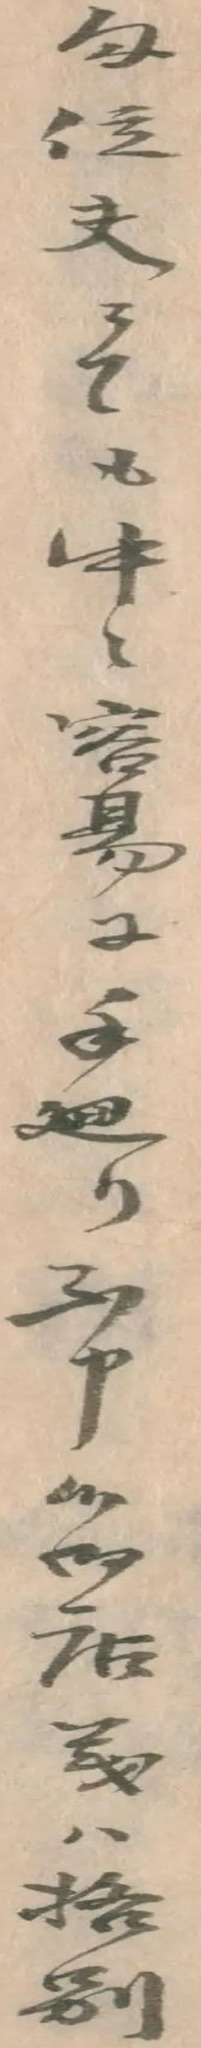匁位夫二ても中々容易に手廻り不申候御店義ハ格別
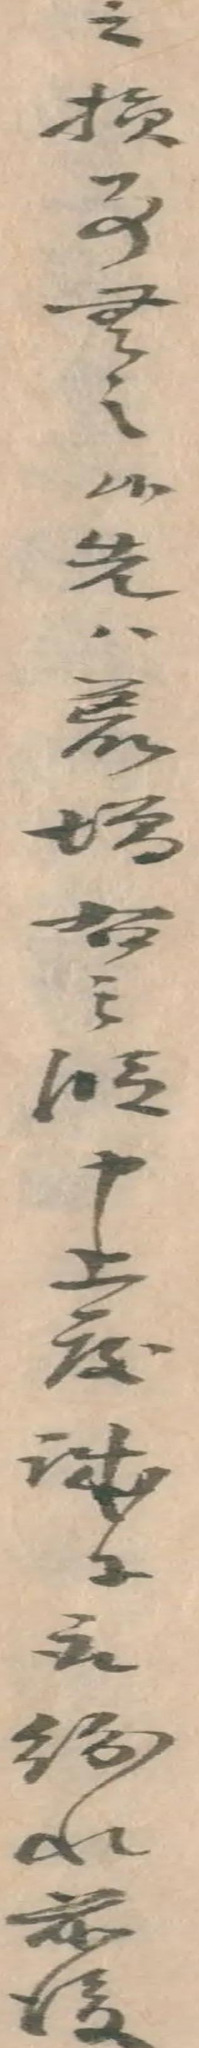之損事無之候先ハ荒増右之段申上度誠に取紛前後

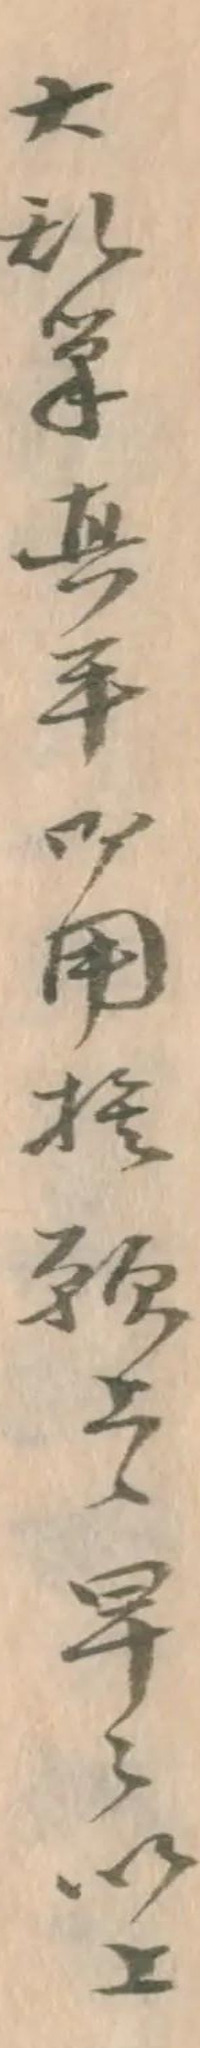大乱筆真平御用捨願上候早々以上
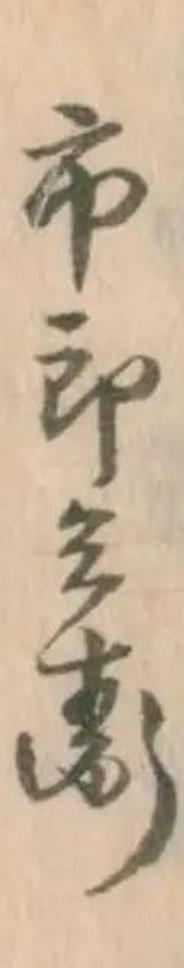市郎兵衛
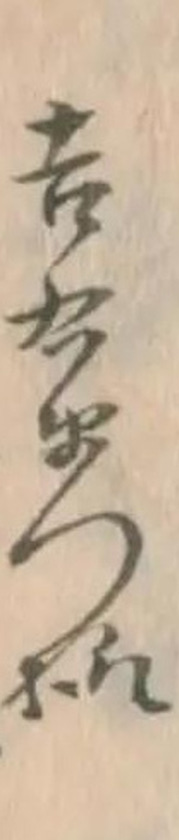吉右衛門様
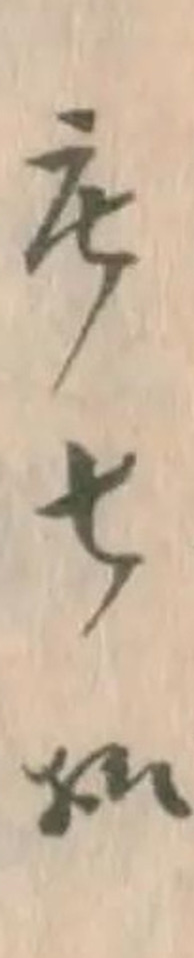庄七様
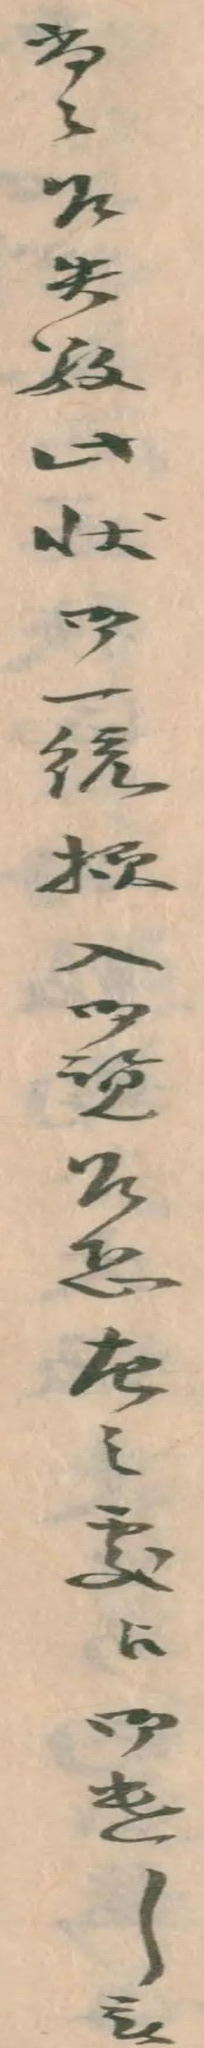尚々乍失敬此状御一統様入御覧乍恐左之処江御遣し被
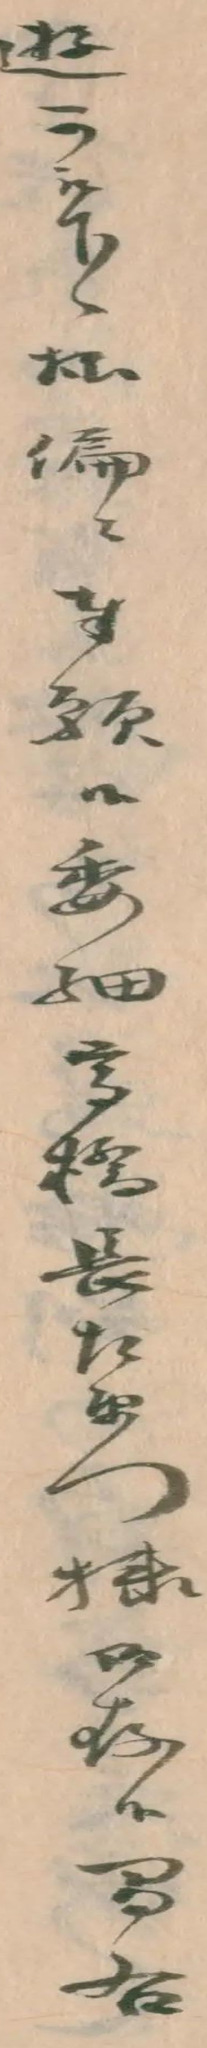遊可被下候様偏二奉願候委細高橋長左衛門様御存候間右
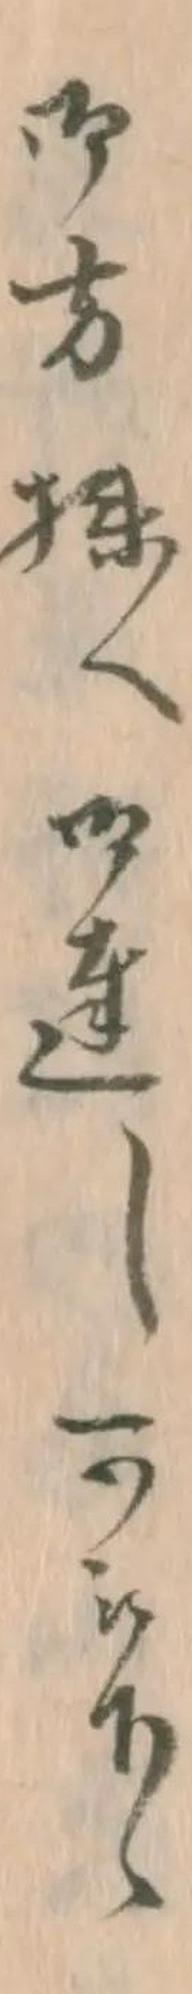御方様へ御達し可被下候
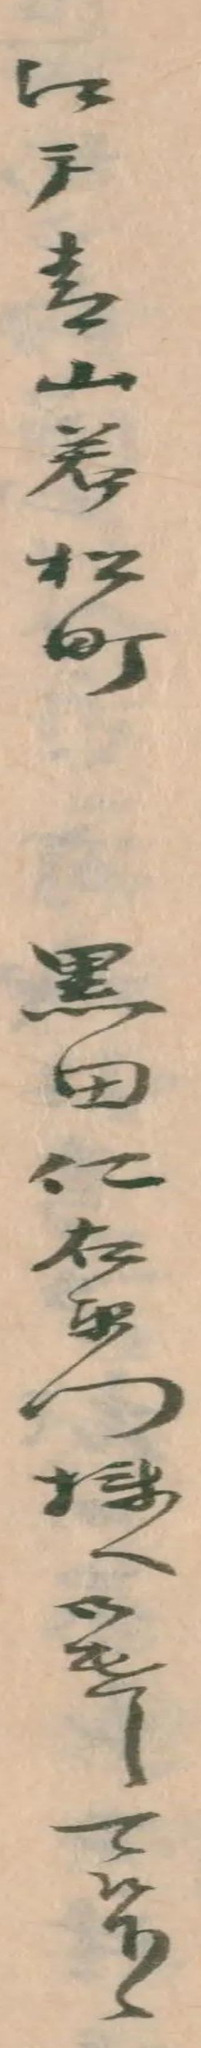江戸青山若松町黒田仁右衛門様へ御遣し可被下候
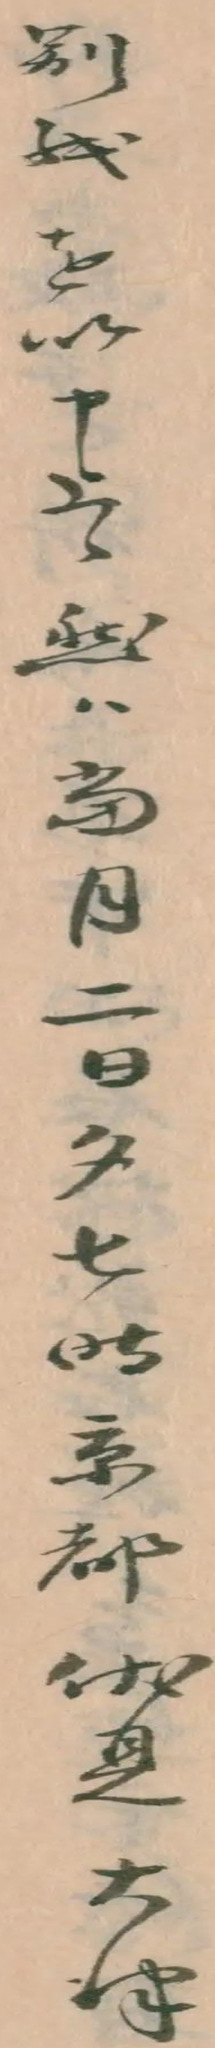別紙を以申上候然ハ当月二日夕七時京都伏見大津
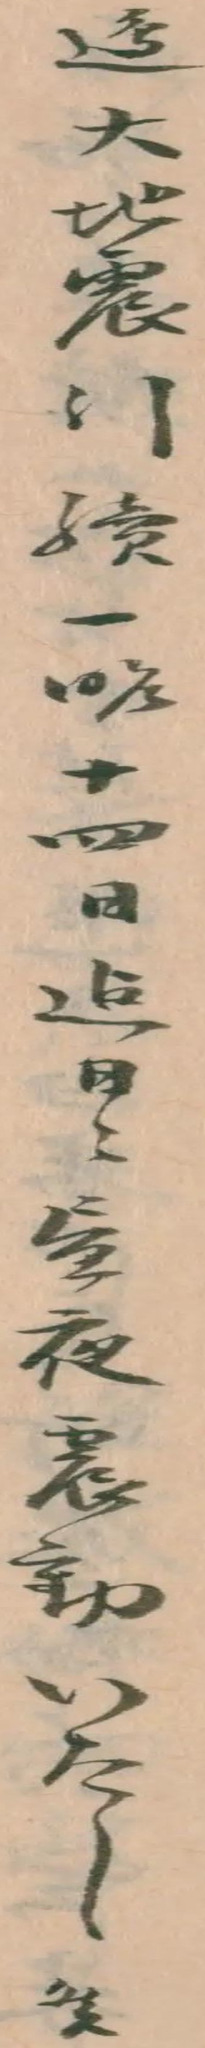辺大地震引続一昨十四日迄日々昼夜震動いたし候
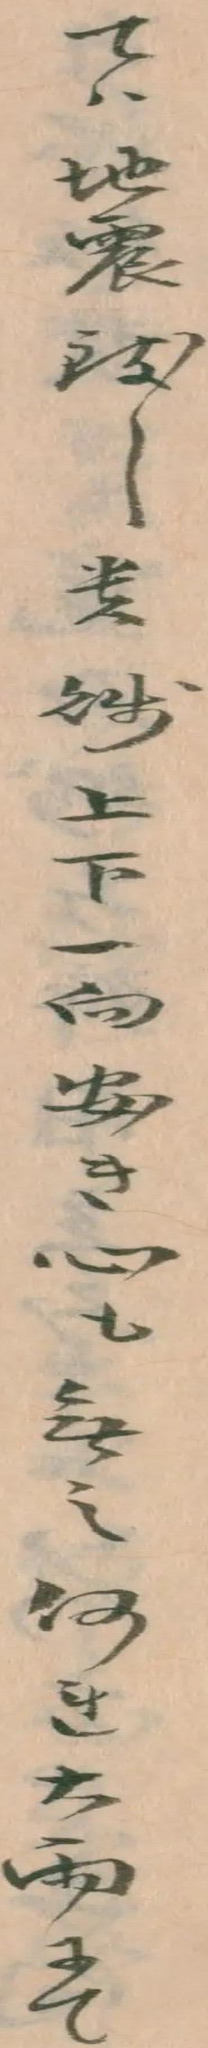てハ地震致し貴賤上下一向安き心も無之何れ大雨にて
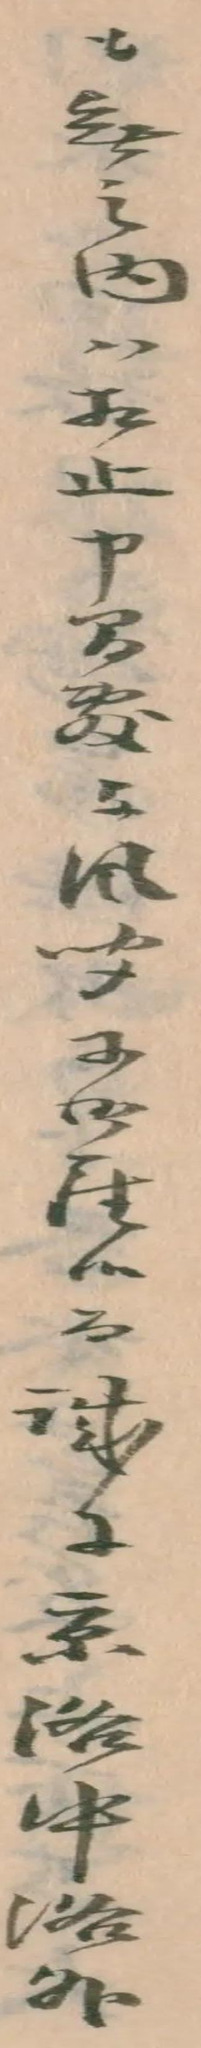も無之内ハ相止申間敷と風聞に御座候而誠に京洛中洛外
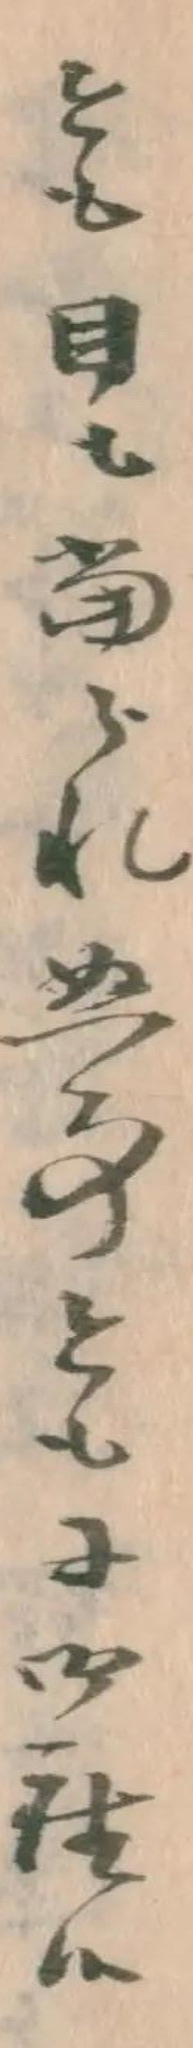とも目も当られぬ事ともに御座候
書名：京都地震
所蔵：国立国会図書館 National Diet Library, JAPAN
